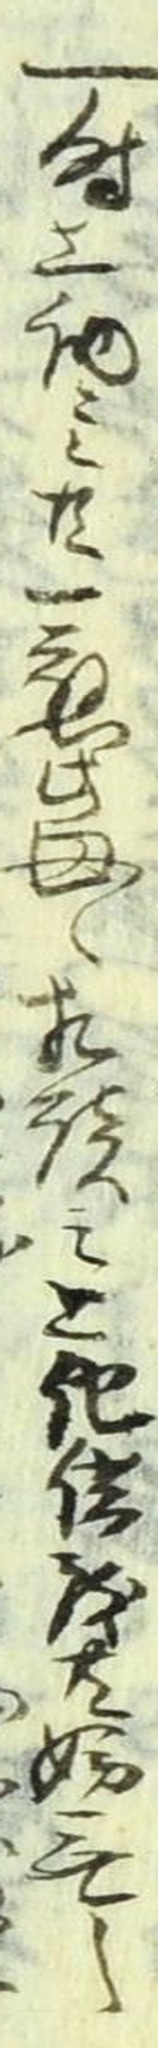一時上納ニ候共一応此母へ相談之上他借致共妨無之
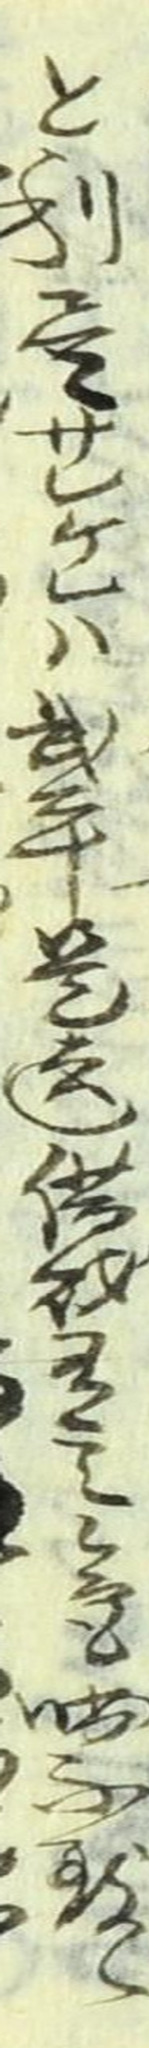と利尽サレケレハ武平是迄借財有之候而も咄不致候
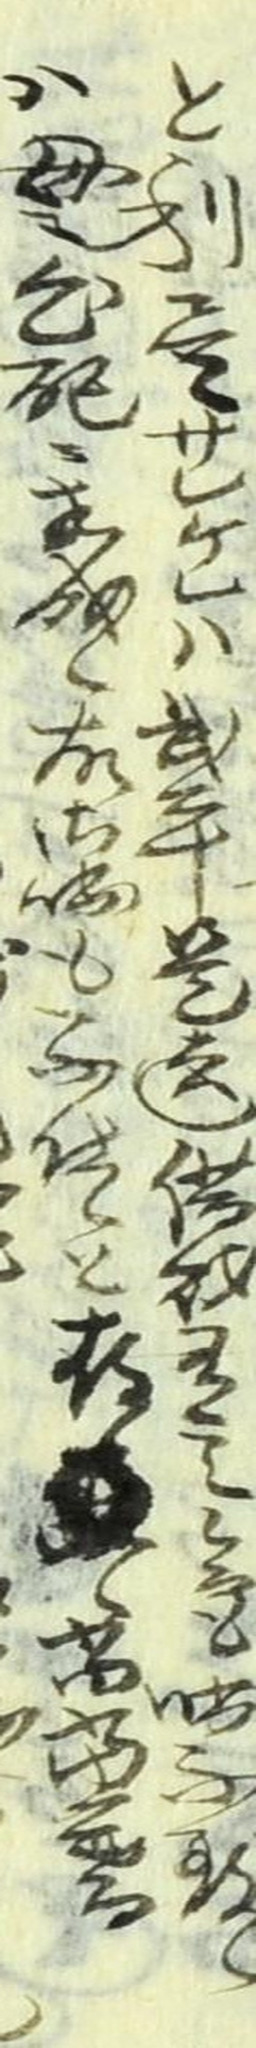ハ母之心配ニ相成候故御咄も不仕候と存候尚当暮
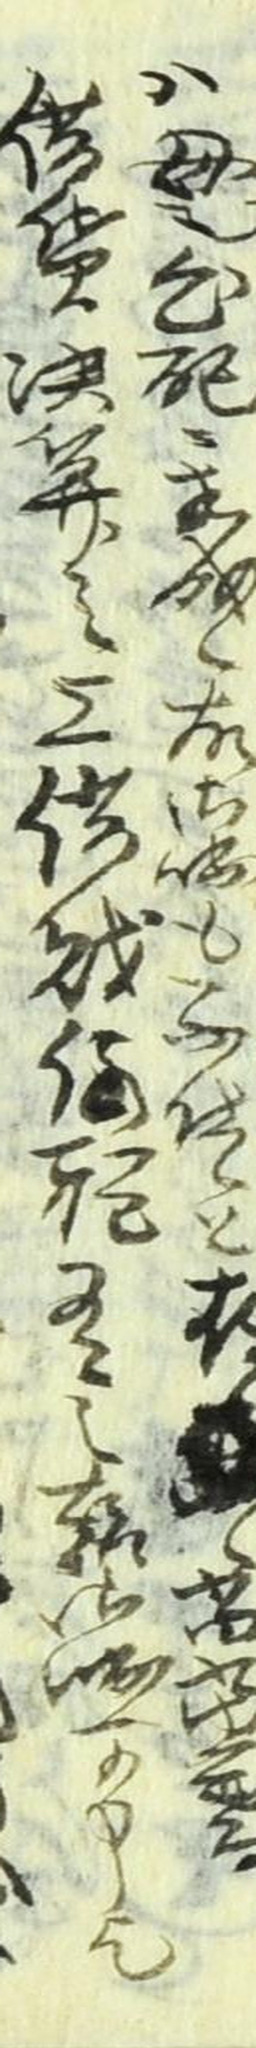借貸決算之上借財何程有之趣御咄可申与
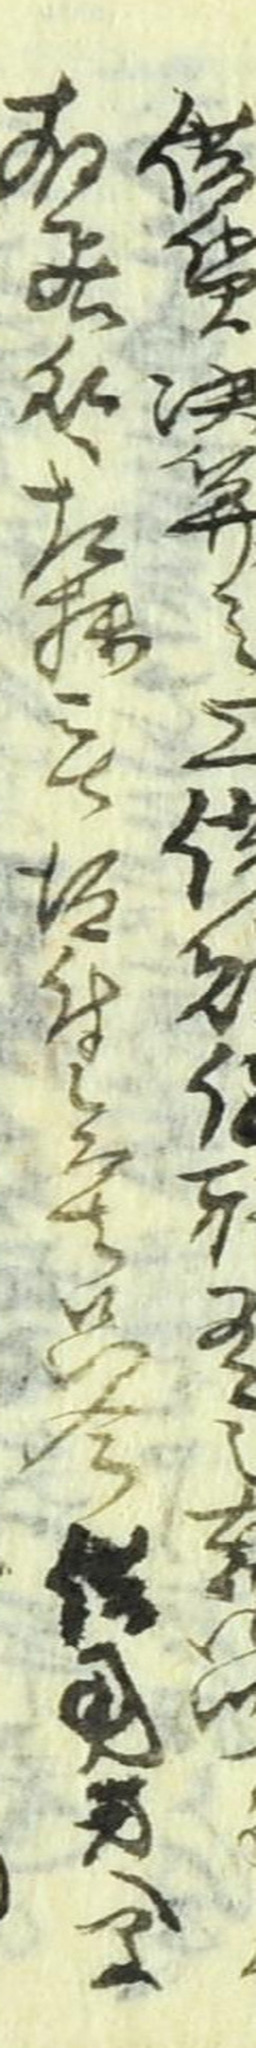存居処へ左様被仰付候而者只今借用方へ早
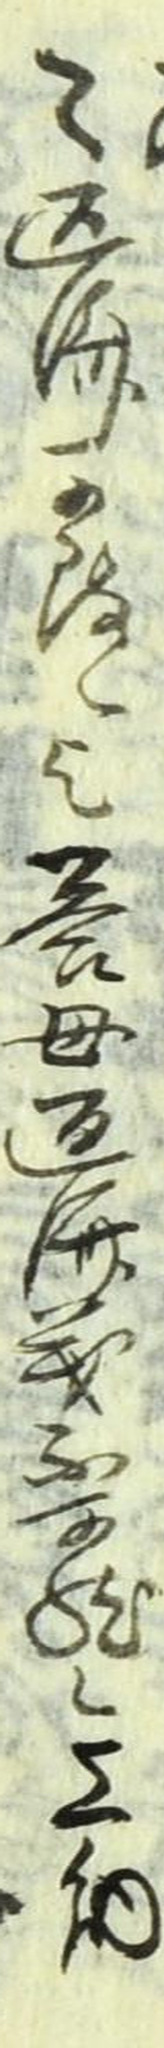々返済可致候与答母返済義不可然候上納
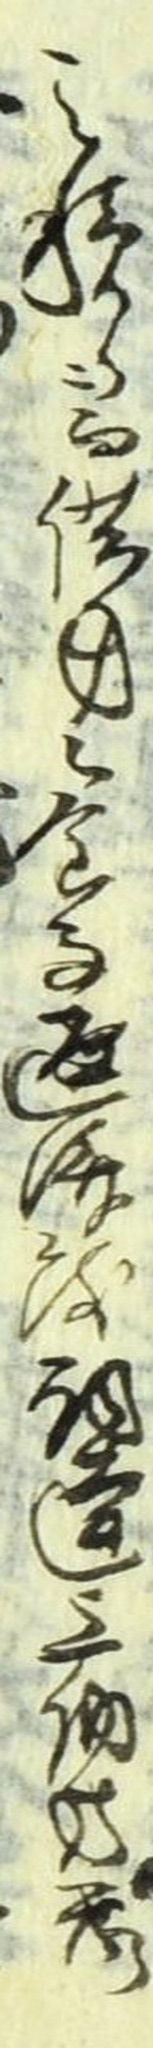之積りニ而借用候金子返済致調達上納方落
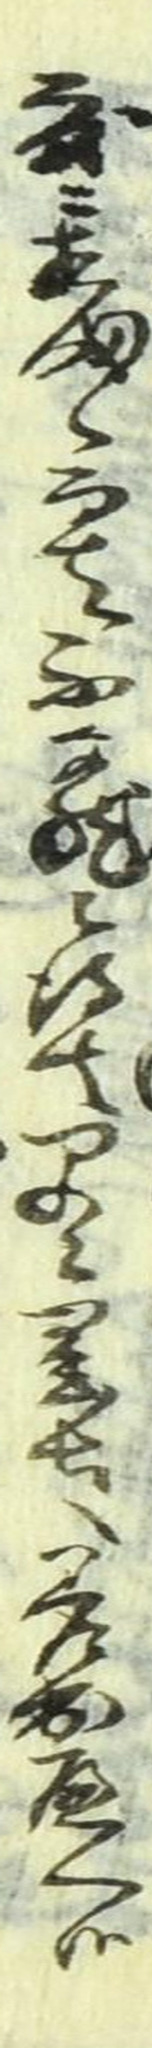度ニ相成候而者不可然候得者早々里長へ差出へく候
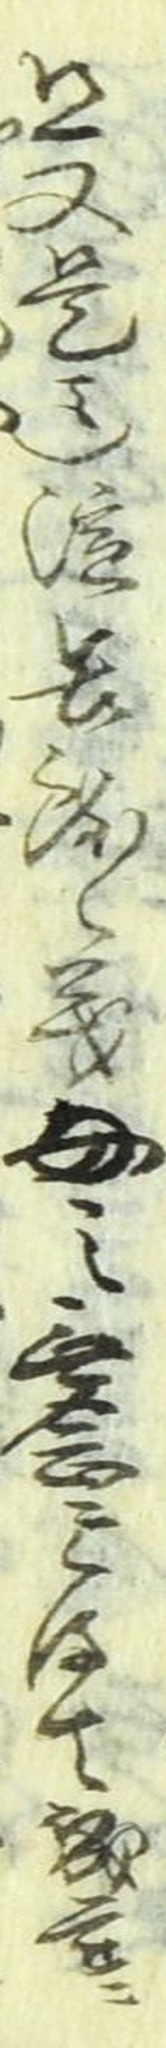且又是迄演舌致候義母之無念ニ候得者幾重ニ
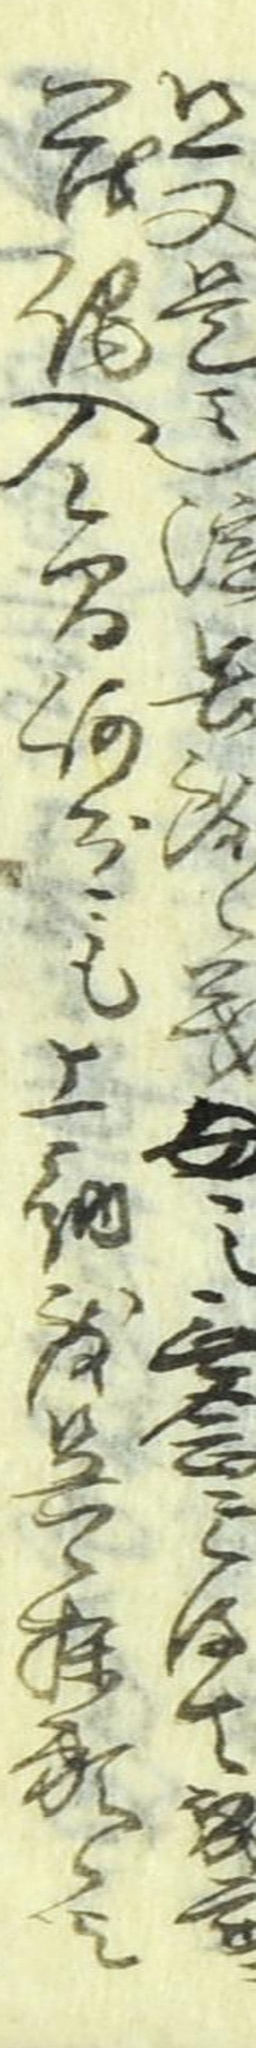茂詫入候間何分ニも上納致呉候様願候与
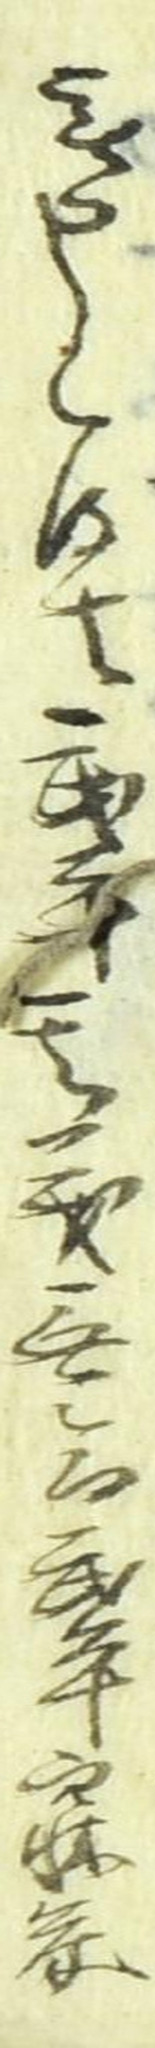被申候得者武平其義無之而武平寝床

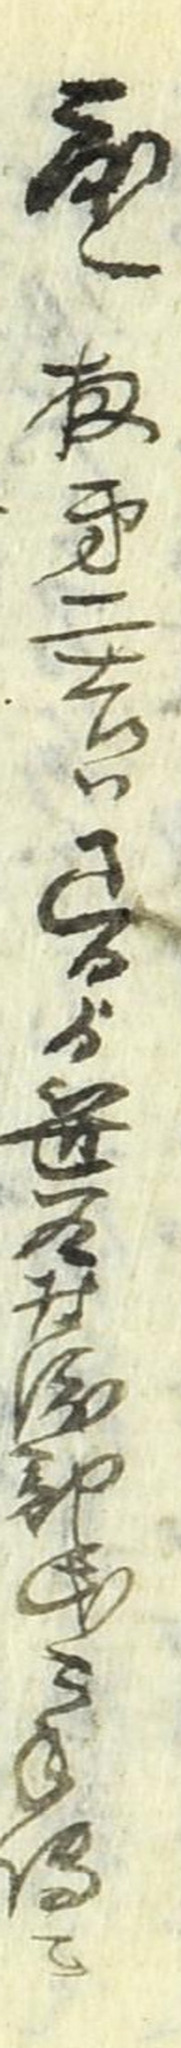致候扨弟二吉ハ過日ゟ笹谷村渡部氏ニ手伝ニ
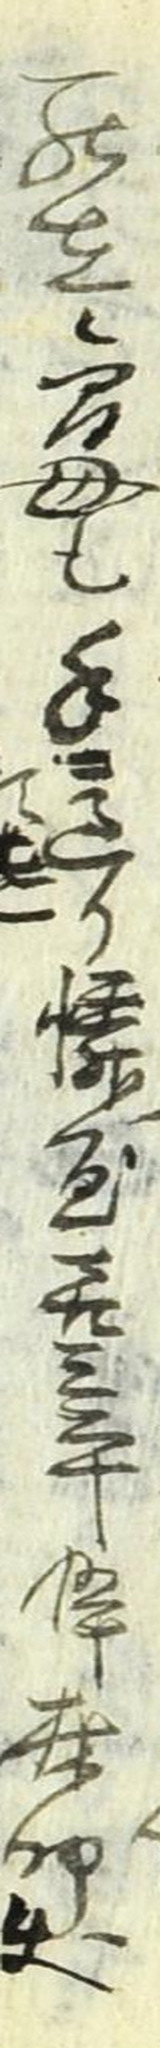罷在候間母も手ニ過り隣屋喜三平倅林助へ使
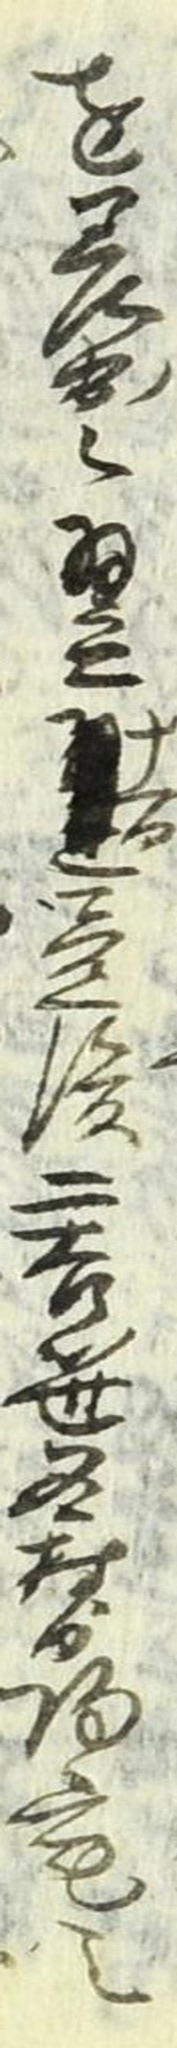を差出候翌十一日昼後二吉笹谷村ゟ帰宅之
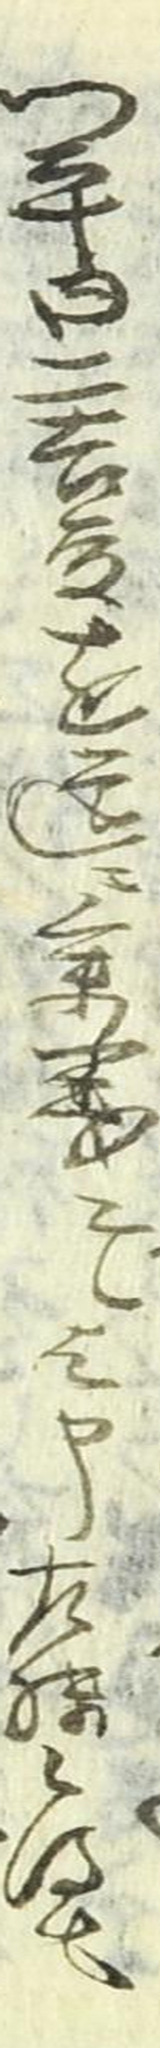門平曰二吉殿を迎ニ参義ニ候与申左様候得者
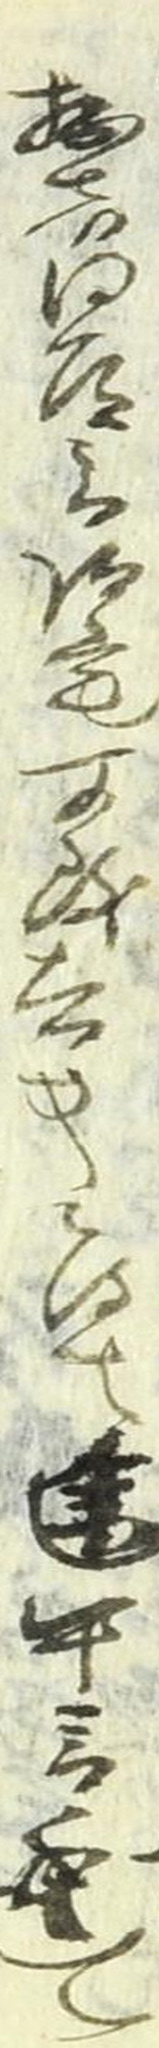拙者同道ニ而帰宅可致旨申候得者途中ニ而逢候
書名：（日記）
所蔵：福井県文書館 Fukui Prefectural Archives
